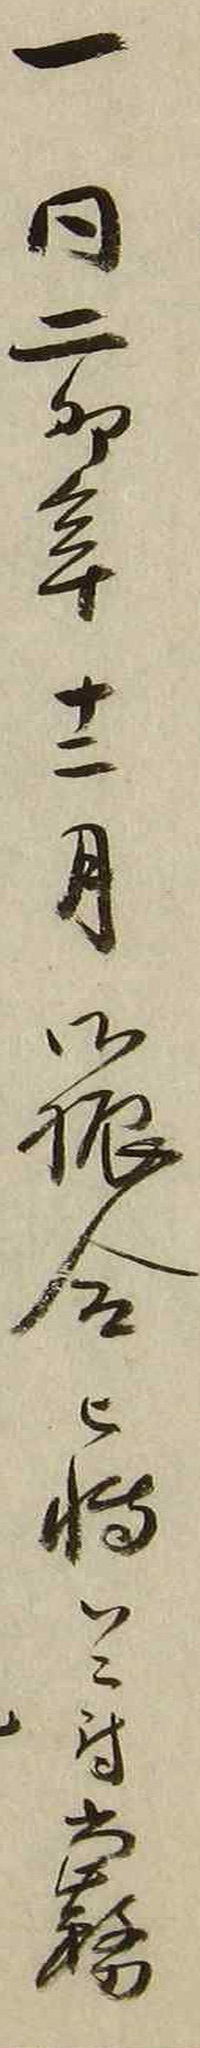一同二卯年十二月御振合被転候ニ付当務
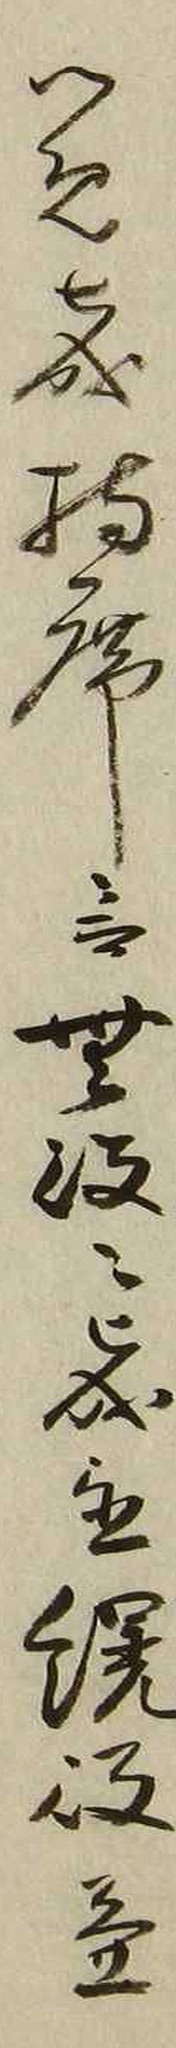御免被成持席ニ而無役ニ被成置縨役兼
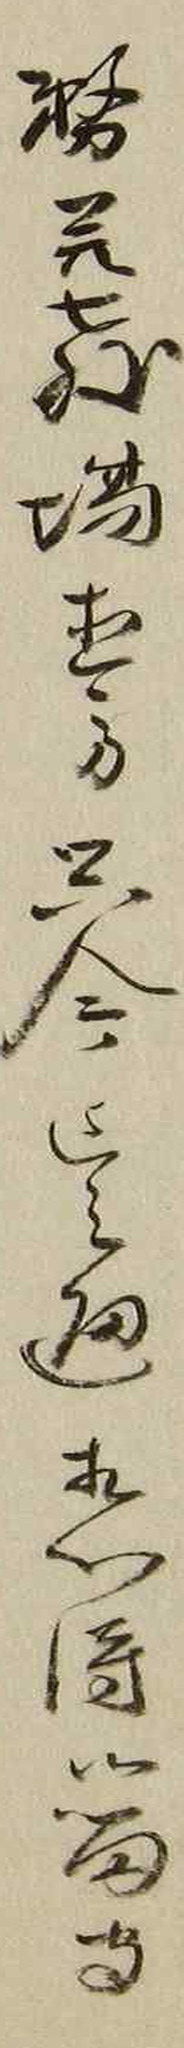務并教場直方只今迄之通相心得御留守
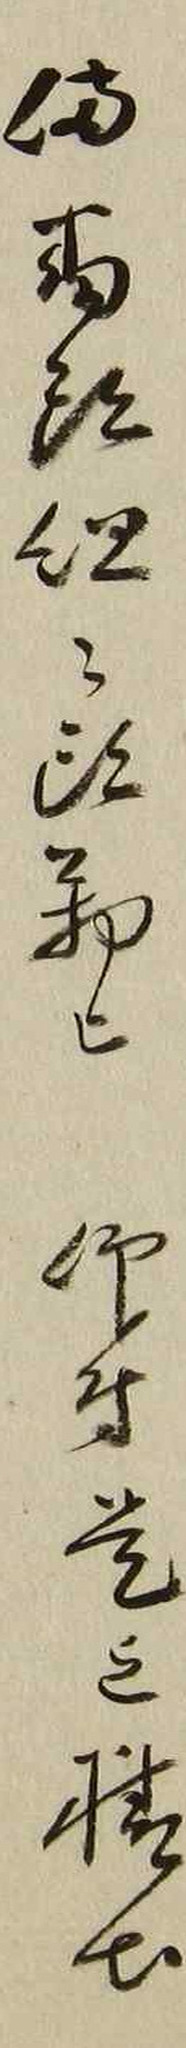備番頭組々頭勤被仰付是迄精出
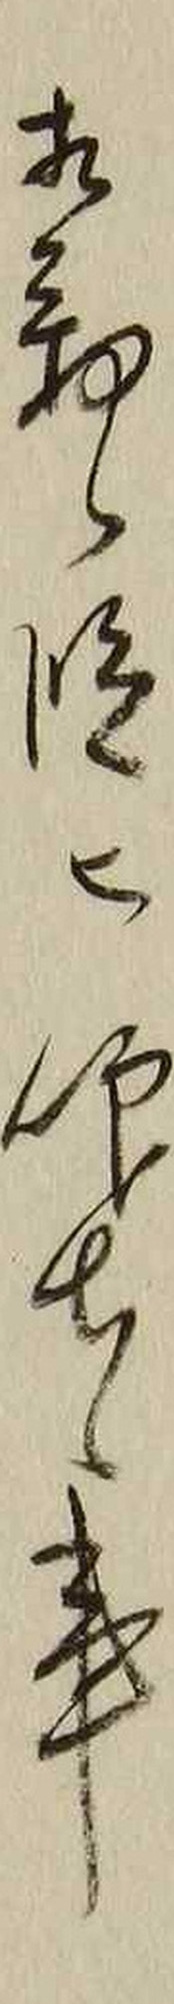相勤候段被仰出候事
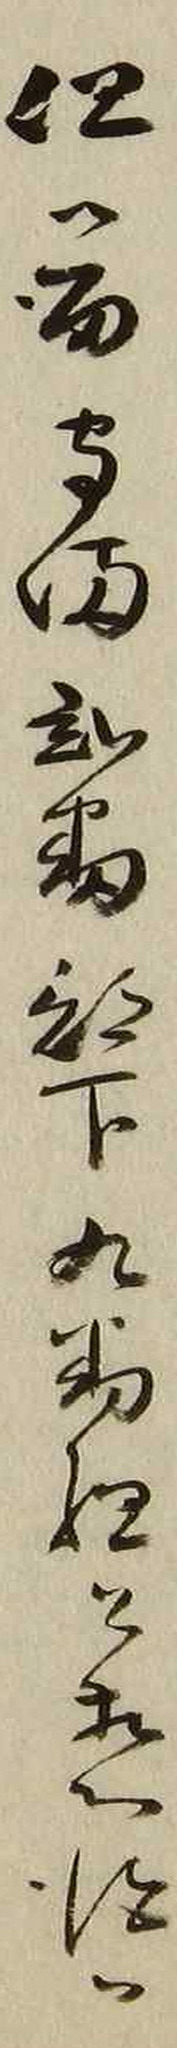但御留守備弐番部下九番組と相心得候
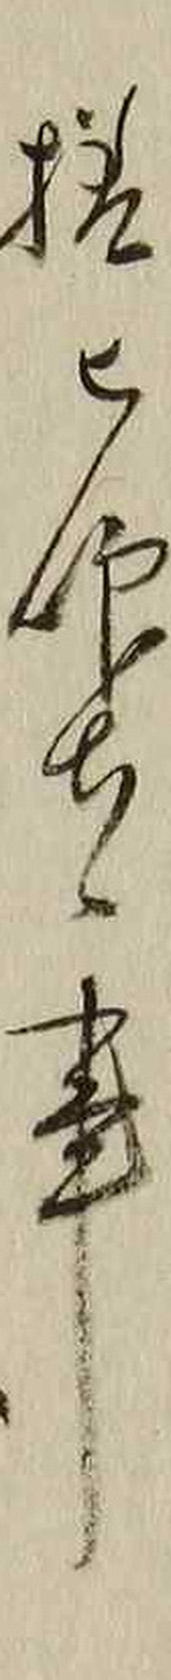様被仰出候事
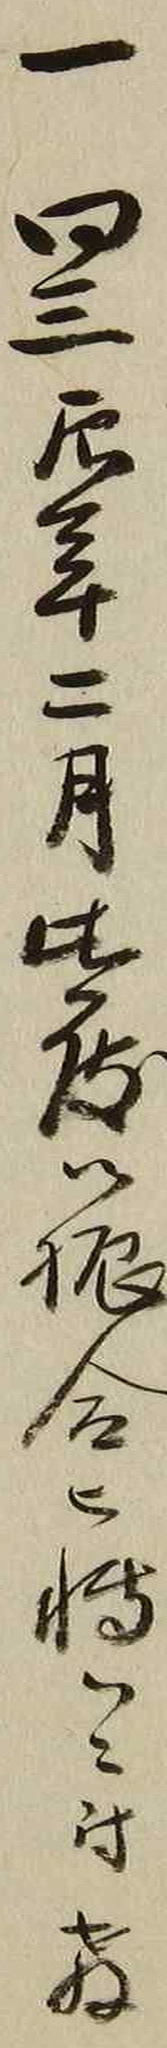一同三辰年二月此度御振合被転候ニ付教
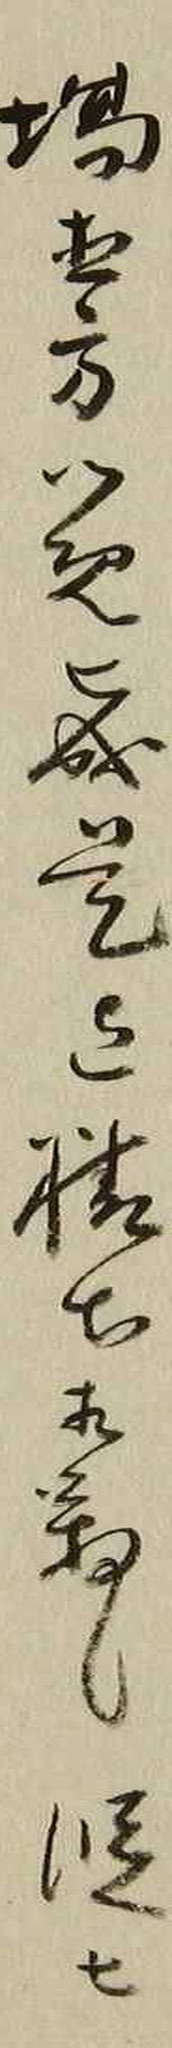場直方御免被成是迄精出相勤候段被
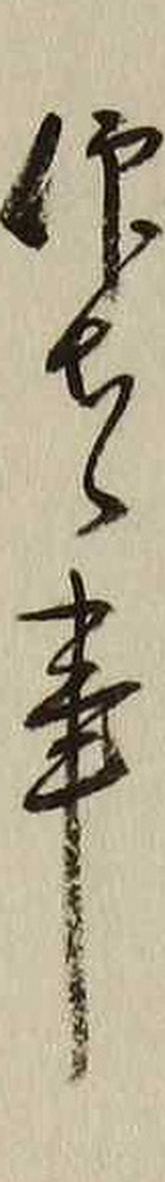仰出候事
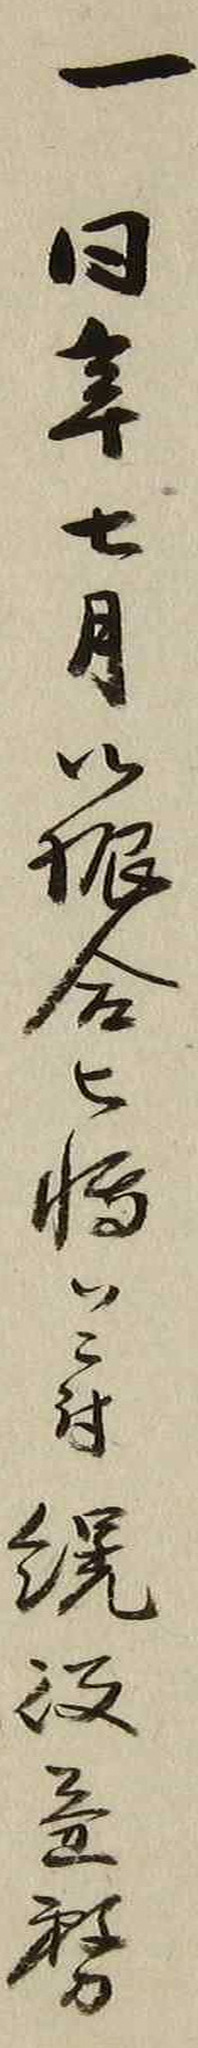一同年七月御振合被転候ニ付縨役兼務
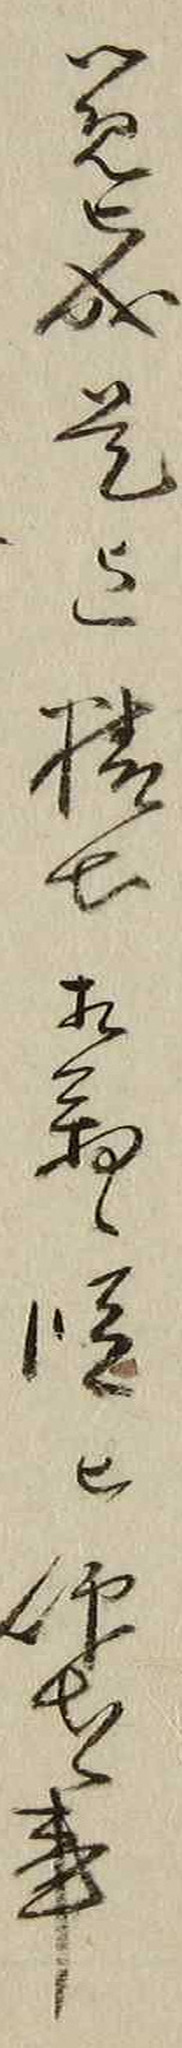御免被成是迄精出相勤候段被仰出候事
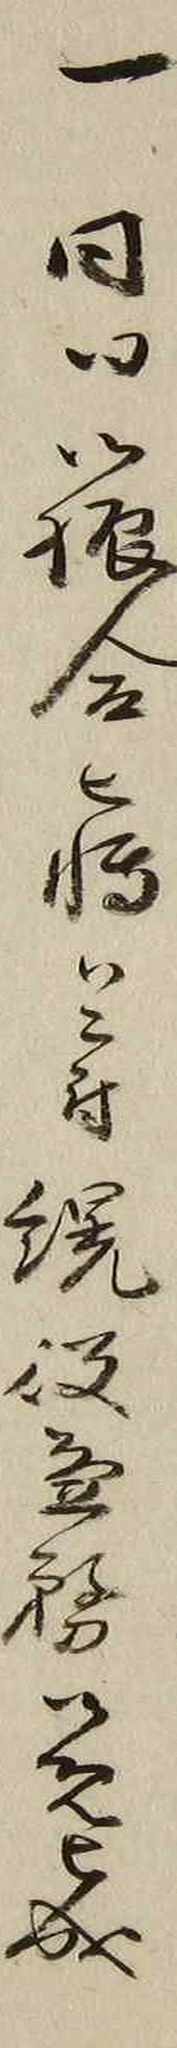一同日御振合被転候ニ付縨役兼務御免被成
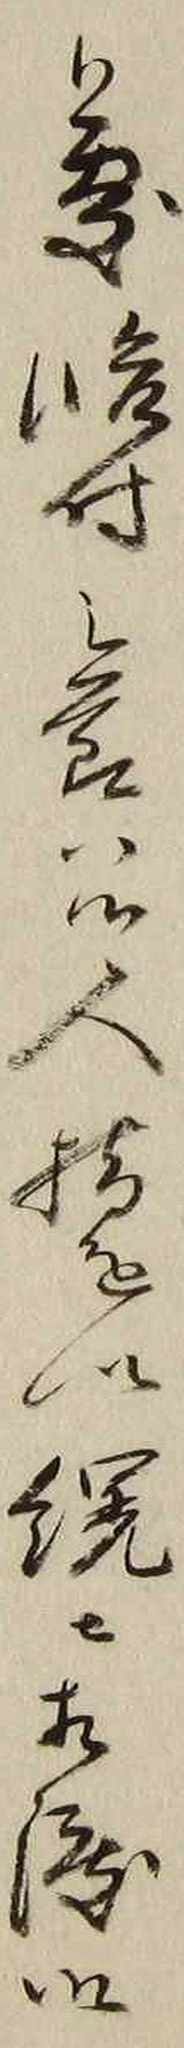候処臨時之節ハ御人指を以縨被相渡御
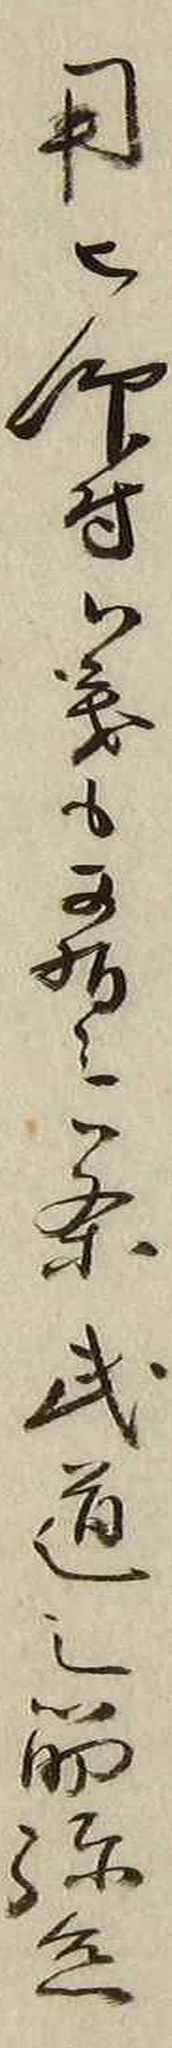用被仰付候義も可有之候条武道之筋弥怠
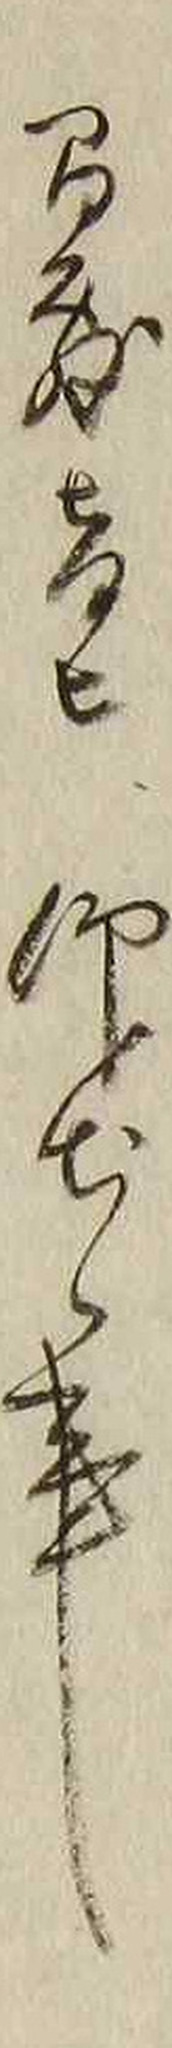間敷旨被仰出候事
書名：諸士系譜　巻之311　し之部1
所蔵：会津若松市立会津図書館
